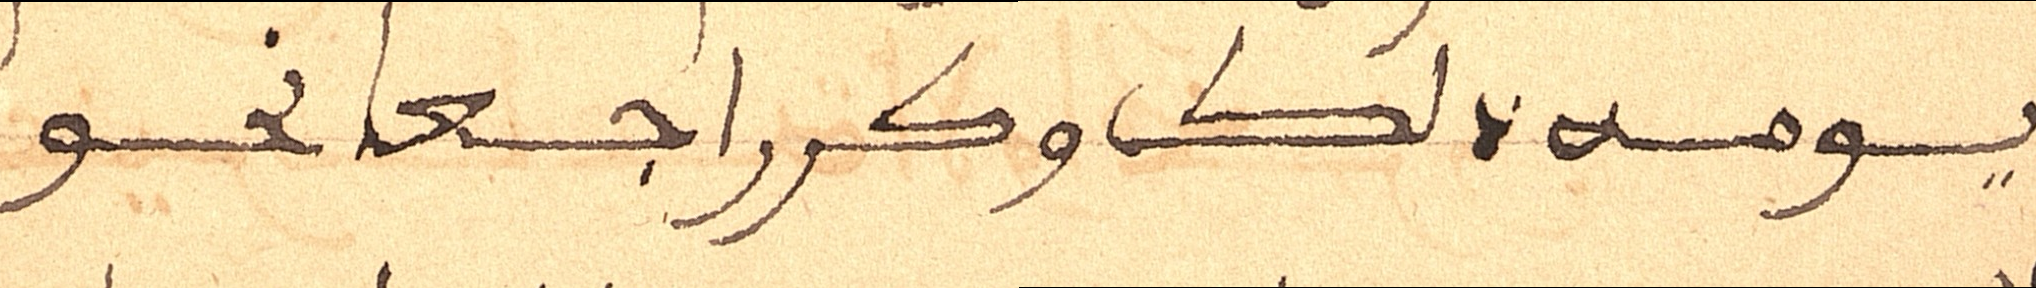يومه ذلك وكر راجعا نحو
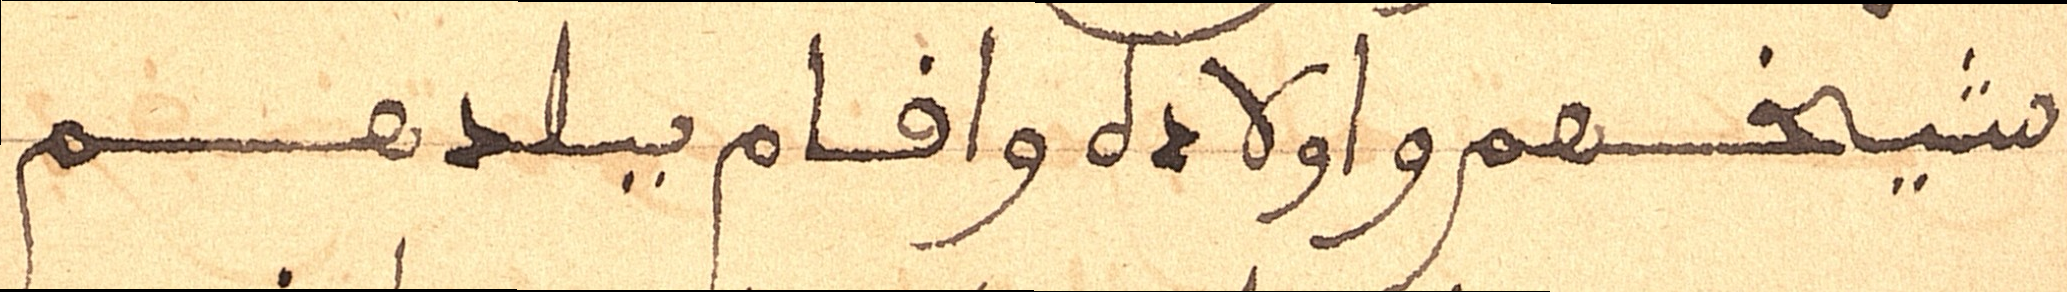شيخهم واولاده واقام ببلدهم
